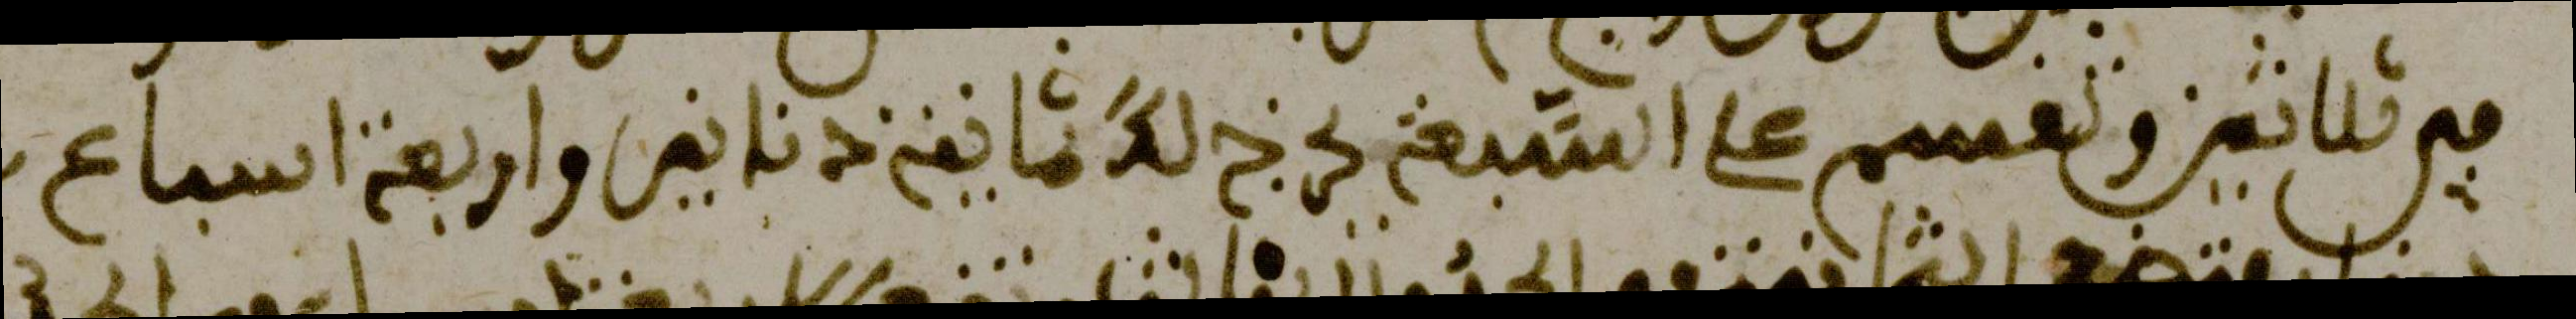في ثلاثين وتقشم على السّبعة يخرج لك ثمانية دنانير واربعة اسباع
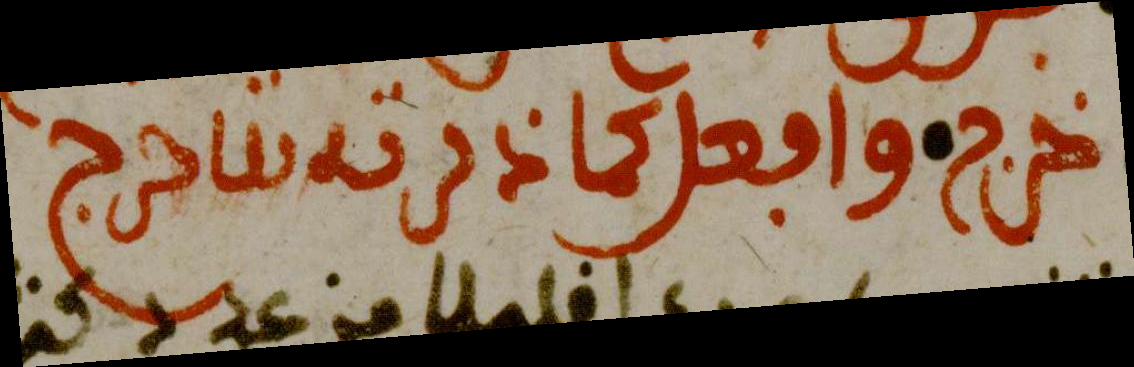وافعل كماذ كرته بلا حرج
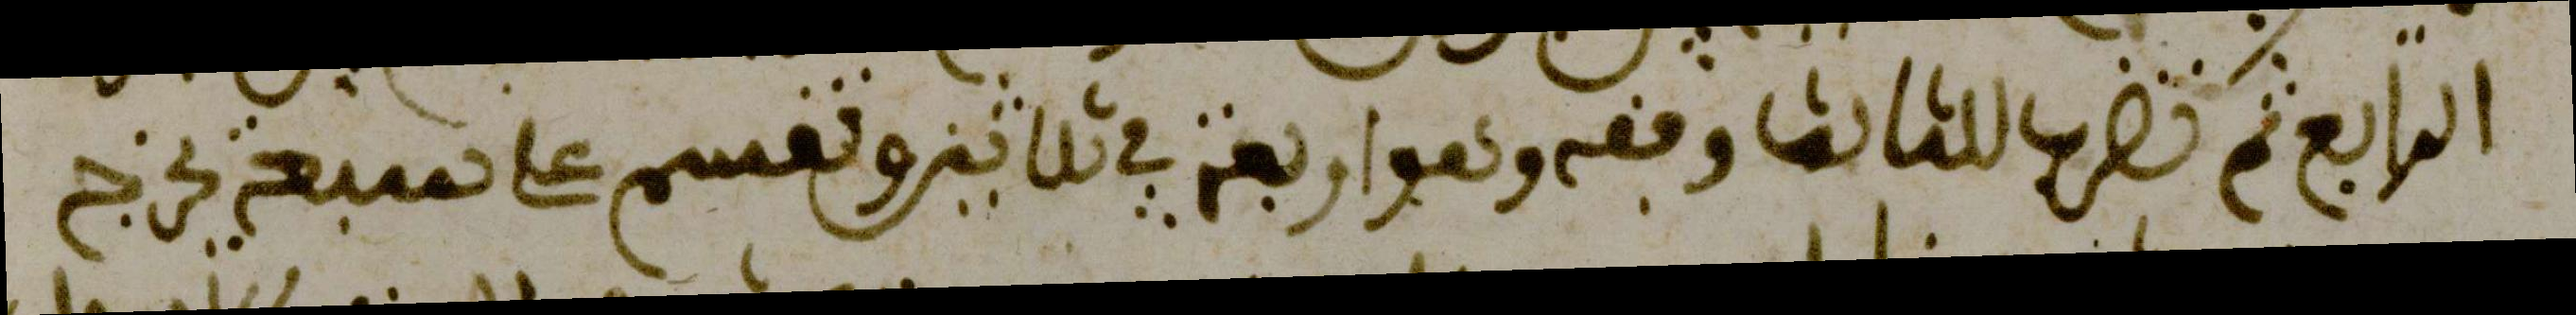الرابع ثم تضرب للثالث وفقه وهو اربعة في ثلاثين وتقسم على سبعة يخرج
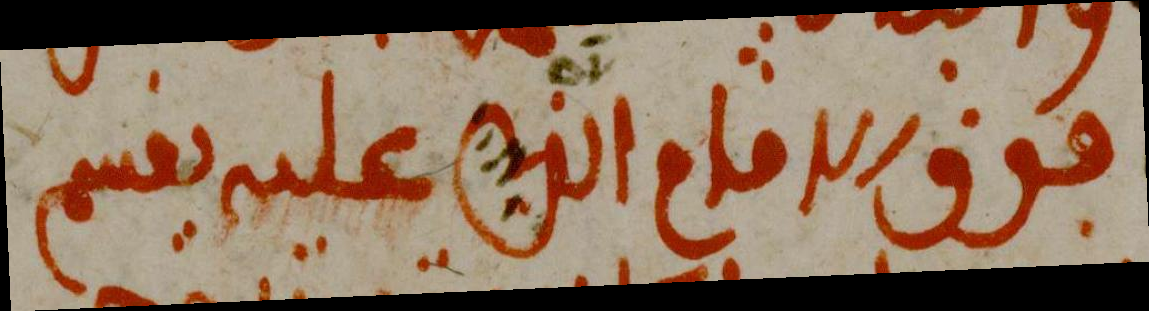فوق الامام الذي عليه يقسم
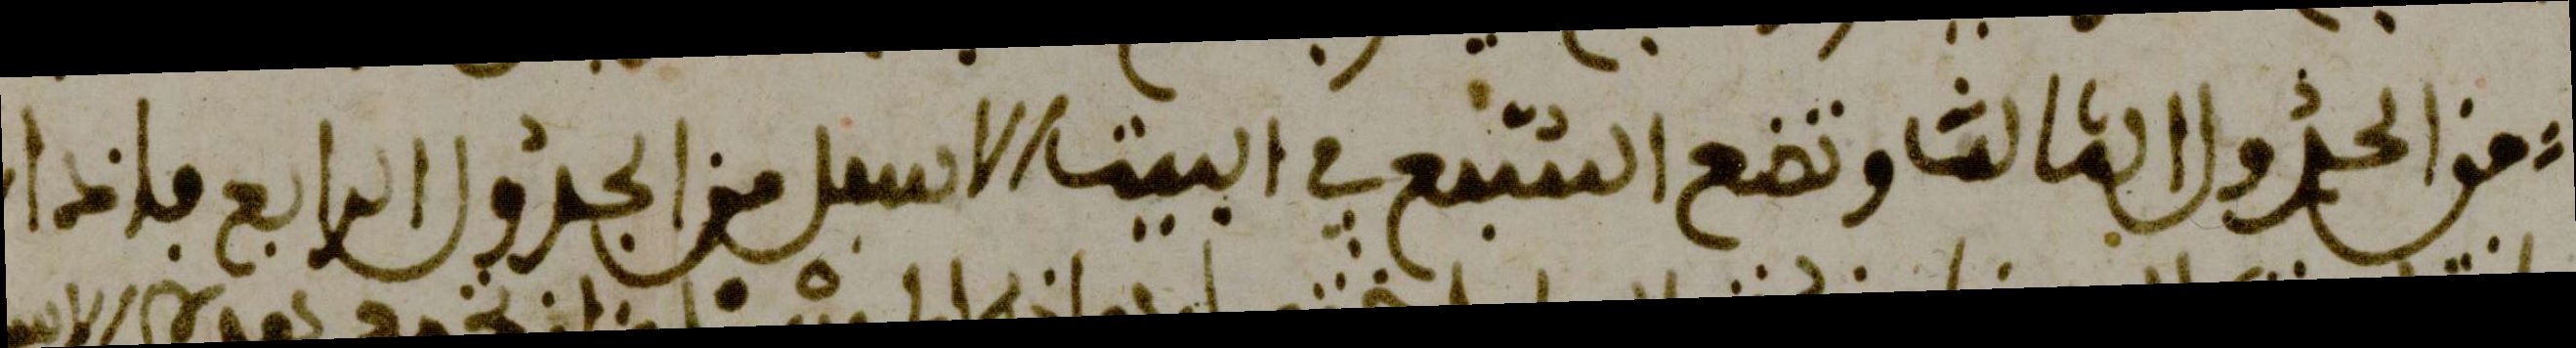من الجدول الثالث وتضع السّبع في البيت الاسفل من الجدول الرابع فاذا
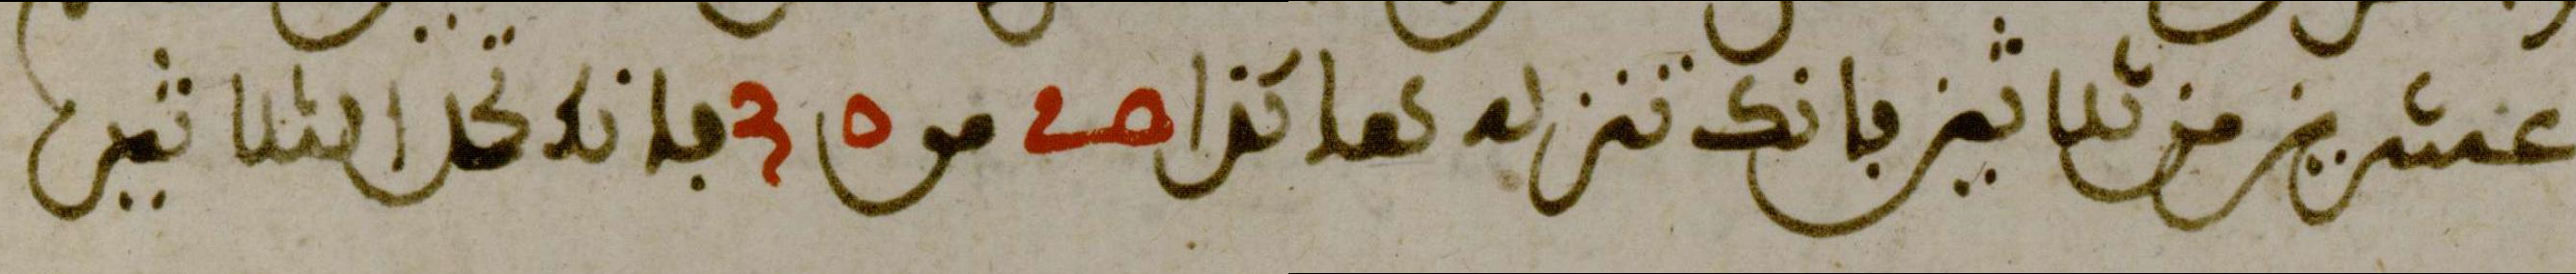عشرين من ثلاثين فانك تنزله هاكذا 20 من 30 فانك تحل الثلاثين
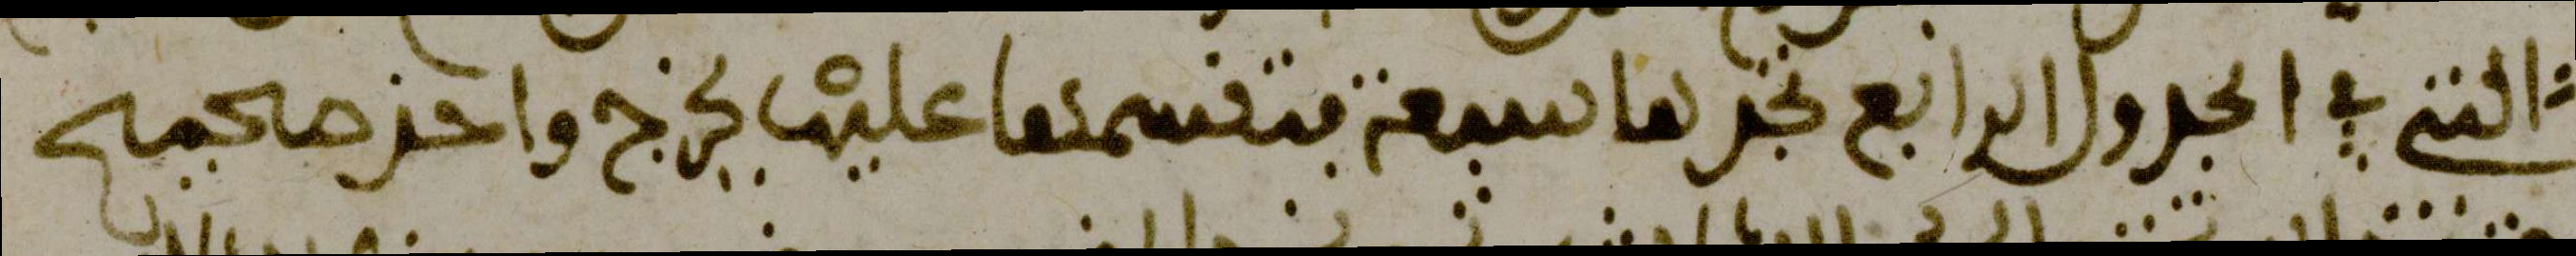التي في الجدول الرابع تجدها سبعة فتقسمها عليْها يخرج واحد صحيح
